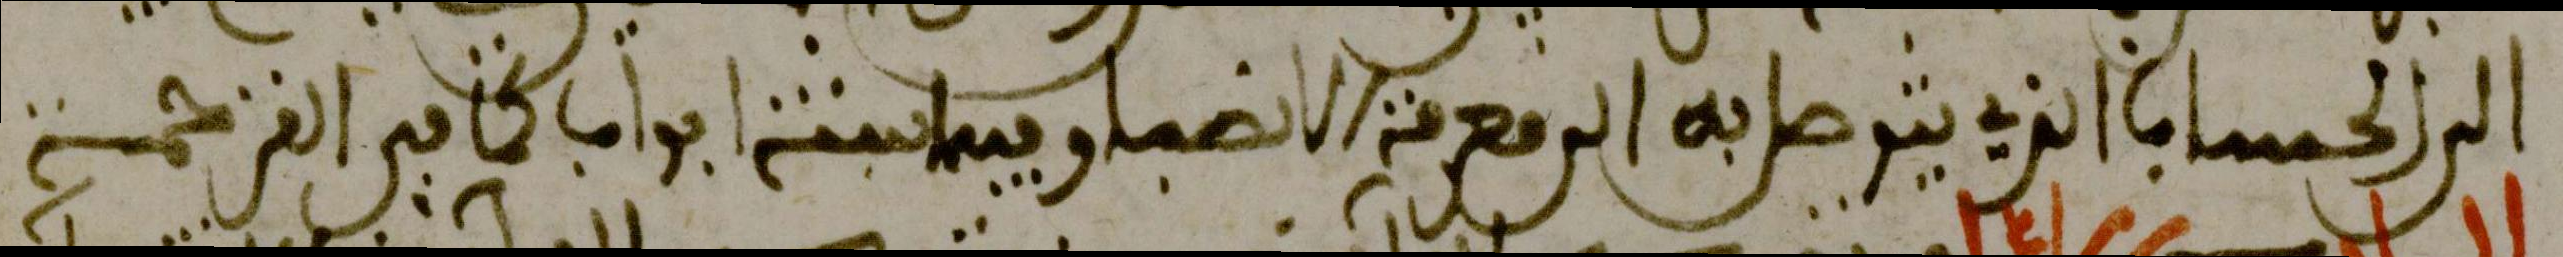الى الحساب الذي يتوصل به الى معرفة الانصبا وفيها ستة ابواب كما في الترحمة
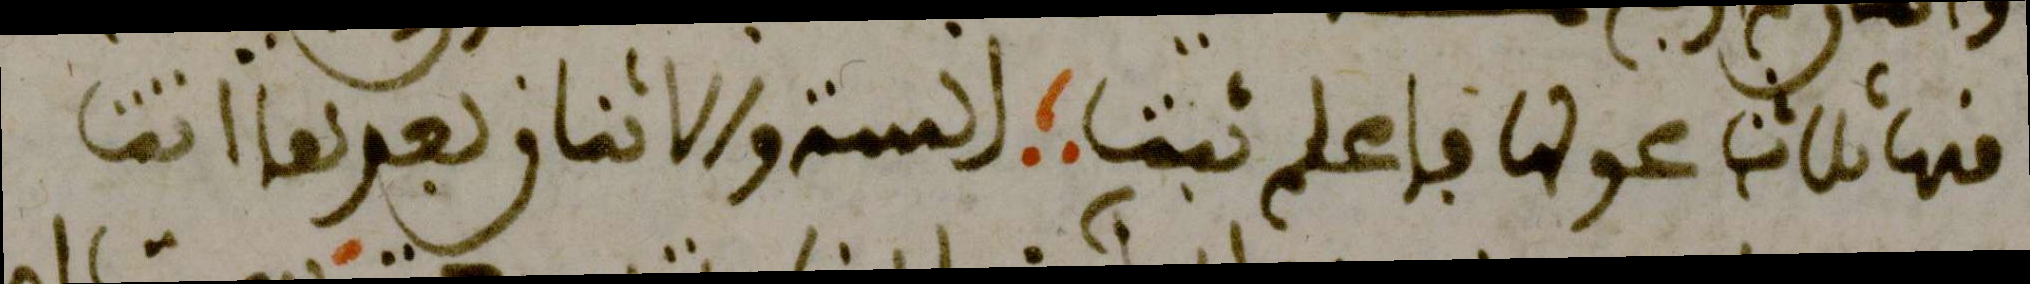منها ثلاث عولها فاعلم ثبت السة والاثنان بعدها اتت
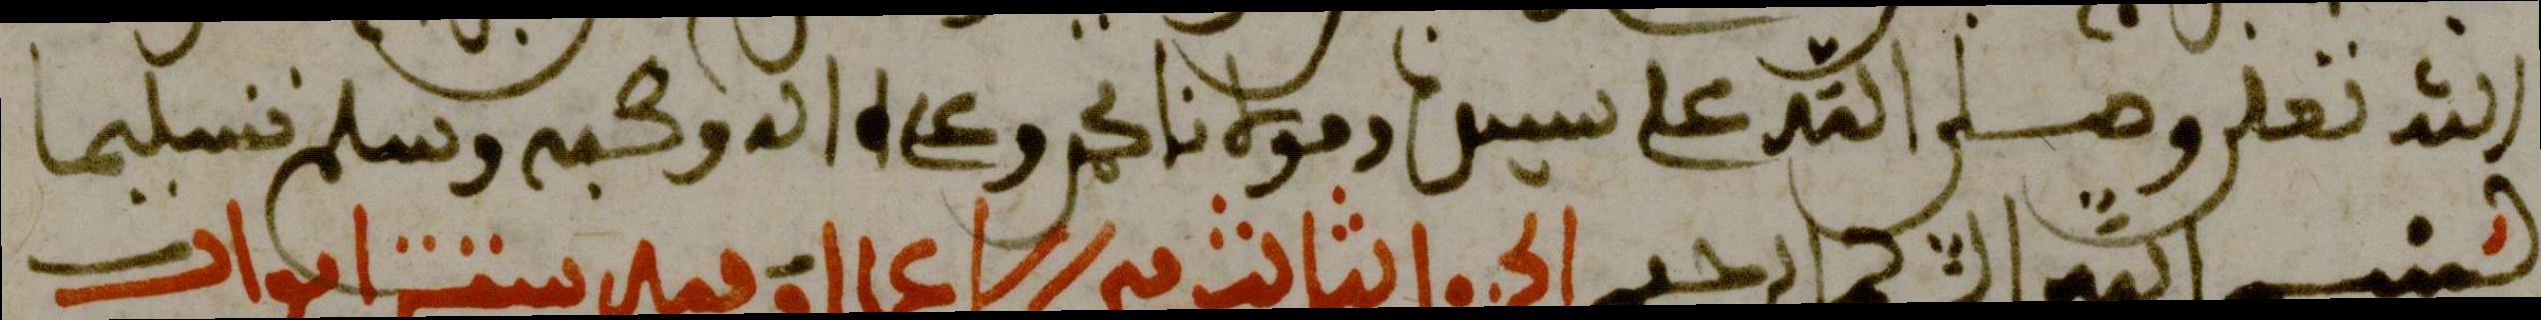الله تعلى وصلى الله على سيدن ومولانا محمد وعلى اءاله وصحبه وسلم تسليما
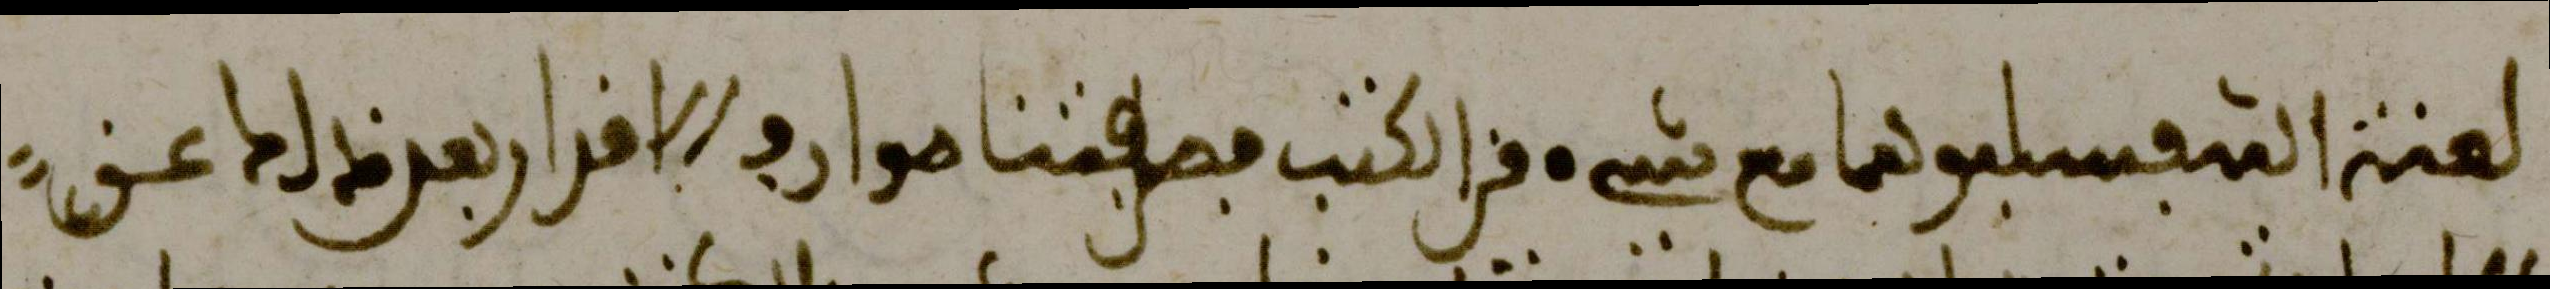لعنة الله فسلبوهما مع شيء من الكتب فصرفتنا صوارف الاقرار بعد ذلك عن
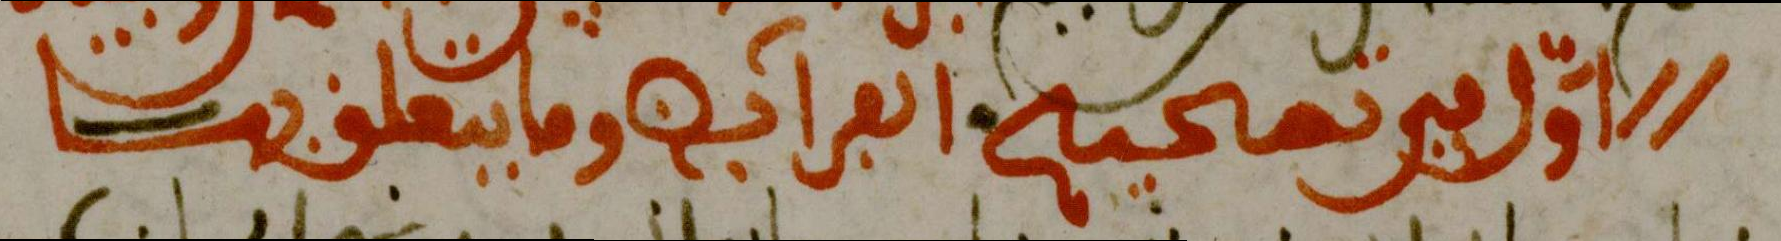الاوَّل في تصحيح الفرائض وما يتعلق بها
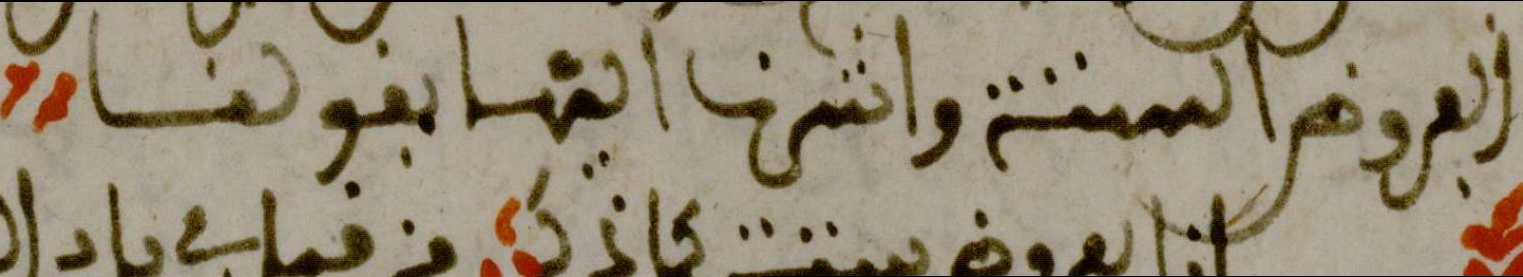الفروض الستة واشرن اليْها بقولنا
